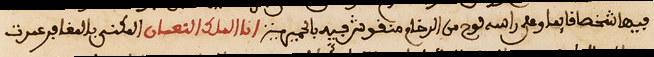فيها شخصا قائما وعلى راسه لوح من الرخام منقوش فيه بالحميرية انا الملك النعمان المكنى بالمغافر عمرت
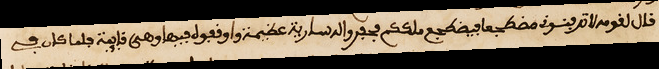قال لقومه لا تدفنونى مضطجعا فيضطجع ملككم فجفروا له سارية عظيمة واوقفوه فيها وهى قائمة فلما كان في
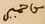من حمير
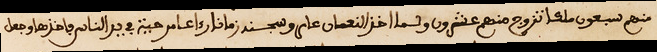منهم سبعون ملكا تزوج منهم عشرون ولما اخذ النعمان عامر وسجنه زمانا رءا عامرحية في يد الناس فاخذها وجعل
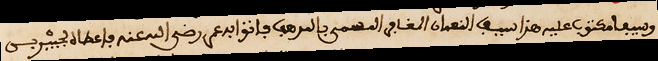وسيفا مكتوب عليه هذا سيف النعمان المغافر المسمى بالمرهب فاتوا به عمر رضى الله عنه فاعطاه لجبير بن
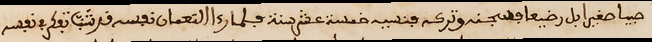صبيا صغيرا بل رضيعا فسجنه وتركه فنسيه خمسة عشر سنة فلما رءا النعمان نفسه قد شبّ تفكر في نفسه
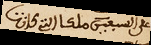على السبعين ملكا التي كانت
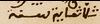ثلاثماية سنة
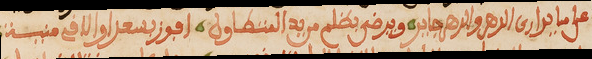على ما يدارى الدهر والدهر جاير ويرضى بظلم من يد المتطاول وافوز بسعد او الاقى منية
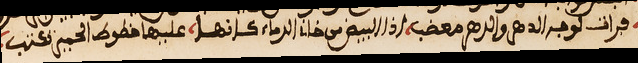فرات لوجه الدهر والدهر معضب اذا البيض من خانى الدماء كانها عليها خطوط الحمير تكتب
